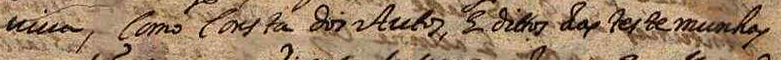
uiua, Como Consta dos Autos, E dittos das testemunhas
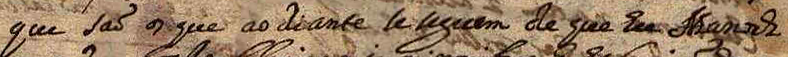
que saõ os que ao diante se seguem de que Eu Manoel
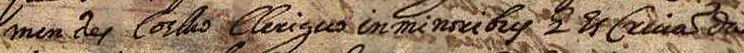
mendes Coelho Cleriguo in minoribus E EsCriuaõ da
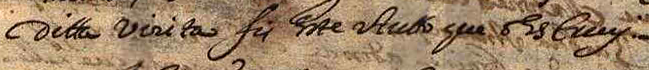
ditta vizita fis Este Autto que o EsCreuj.
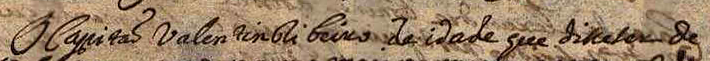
O Capitaõ Valentin Ribeiro de idade que disse ser de
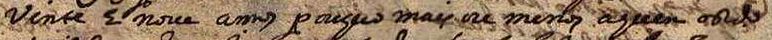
vinte E noue annos pouquo mais ou menos a quen o Rdo
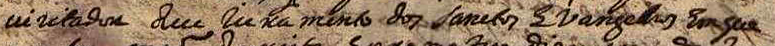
uizitador deu Iuramento dos Sanctos EVangelhos Em que
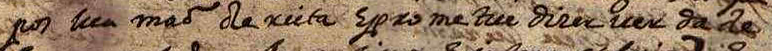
pos sua maõ dereita E prometeu dizer uerdade
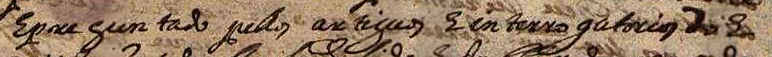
E preguntado pellos artiguos E interrogatorios do E
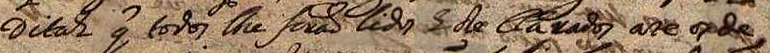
dital q̄ todos lhe forão lidos E declarados ate os de
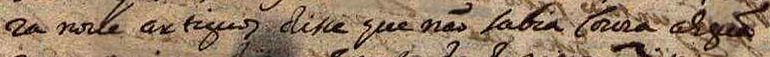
zanoue artiguos disse que não sabia Couza alguā
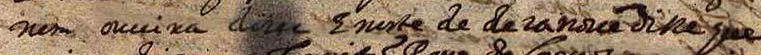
nem ouuira dizer, E neste de dezanoue disse que
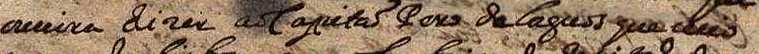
ouuira dizer ao Capitaõ Pero de laguos que ueio
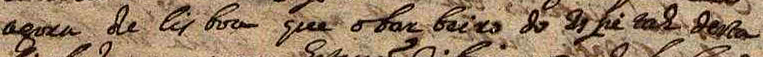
agora de lisboa que o barbeiro do Espital desta
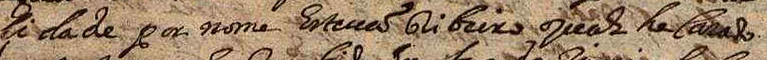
Cidade por nome Esteuaõ Ribeiro, o qual he Cazado
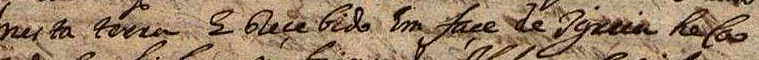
nesta terra E Recebido em face de Igreia he Ca
